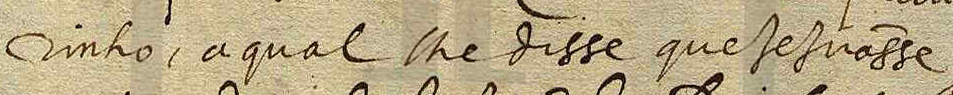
rinho, a qual lhe disse que JeJuāsse
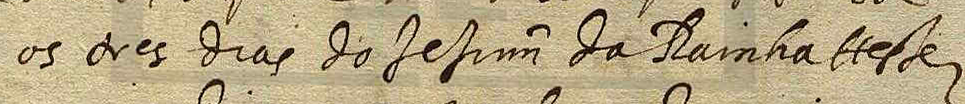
os tres dias do JeJum da Rainha Hester
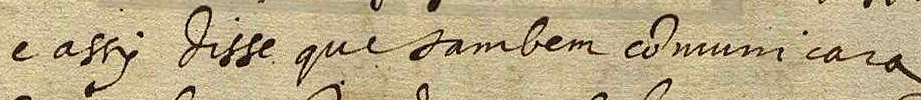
e assy disse que tambem cōmunicara
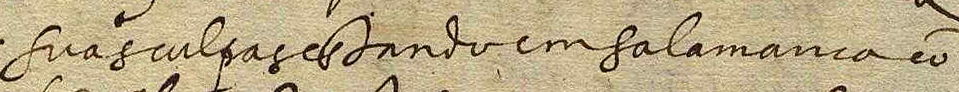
suas culpas estando em salamanca cō
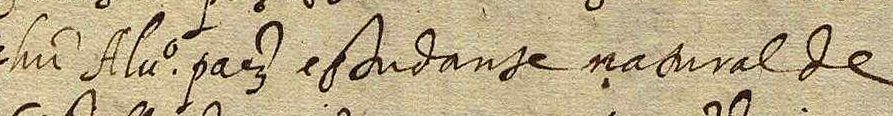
hū Aluo. paez̄ estudante natural de
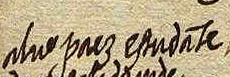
aluo paez estudāte
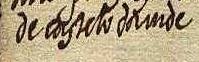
de castelo da uide
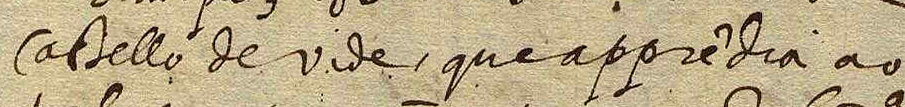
Castello de vide, que apprēdia ao
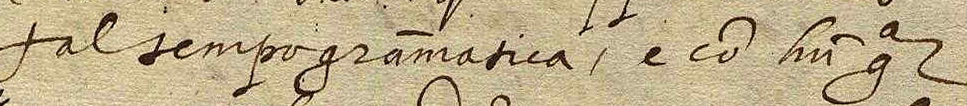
tal tempo gram̄atica , e cō hū gar
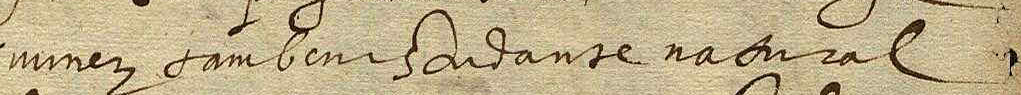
nunez tambem studante natural
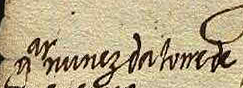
gar nunez da torre de
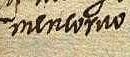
mencoruo
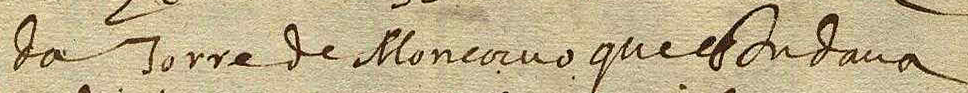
da Torre de Moncoruo que estudaua
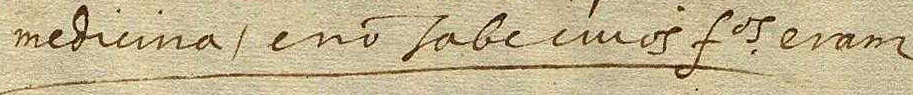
medicina , e nō sabe cuios fos. eram
